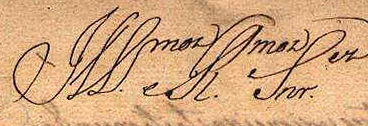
Ill.mos R.mes Snr.es
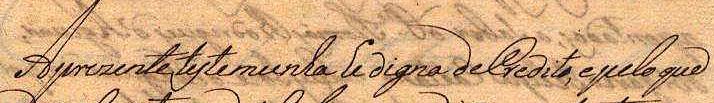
A prezente testemunha he digna de Credito, e pelo que
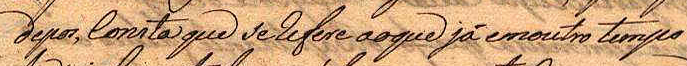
depos, Consta que se Refere ao que já em outro tempo
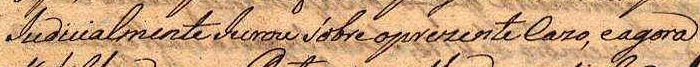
Iudicialmente Iurou sobre o prezente Cazo, e agora
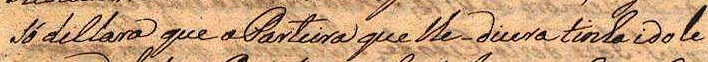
só deClara que a Parteira que lhe-dicera tinha ido le
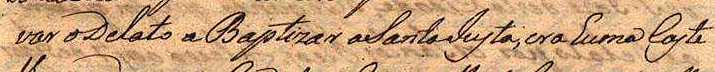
var o Delato a Baptizar a Santa Iusta, era huma Caste
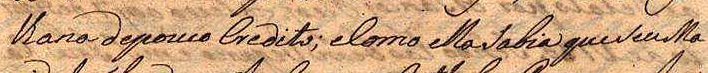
lhana de pouco Credito; e Como ella sabia que seu Ma
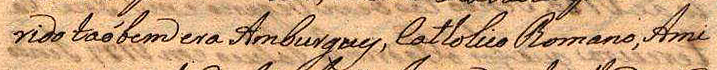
rido taõbem era Amburgues, Catholico Romano, Ami
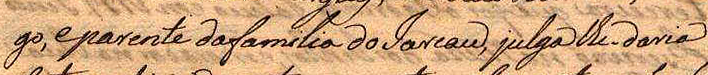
go, e parente da familia do Iarcau, julga lhe-daria
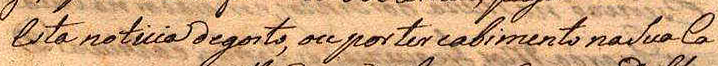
esta noticia de gosto, ou por ter cabimento na sua Ca
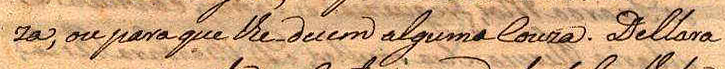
za, ou para que lhe decem alguma Couza. DeClara
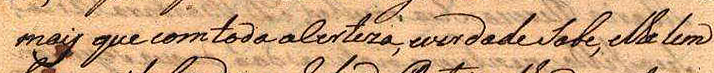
mais que com toda a Certeza, e verdade sabe, e lhe lem
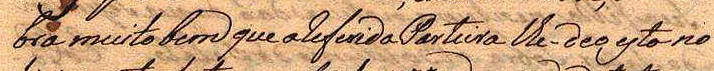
bra muito bem que a Referida Parteira lhe deo esta no
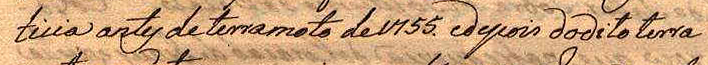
ticia antes de terramoto de 1755 e depois do dito terra
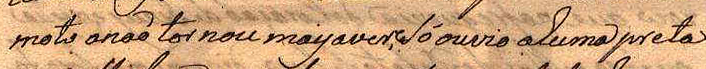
moto a naõ tornou mais a ver, e só ouvio a huma preta
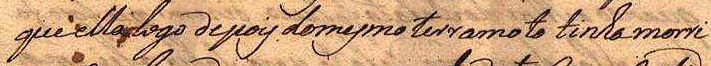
que ella logo depois do mesmo terramoto tinha morri
